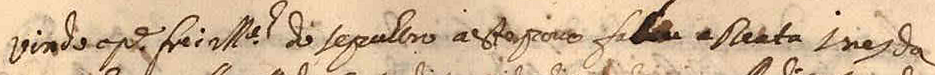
Vindo o pe frei M.el do Sepultro a este pouo falar a Beata Ines da
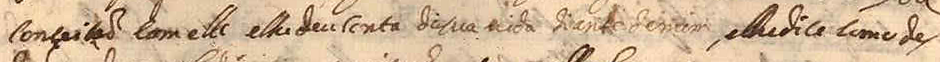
Conceiçaõ com elle e lhe deu conta de sua uida diante de mim, e lhe dice como des
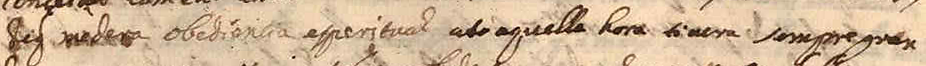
de q̄ me dera obediencia esperitual ate aquella hora tiuera sempre gran
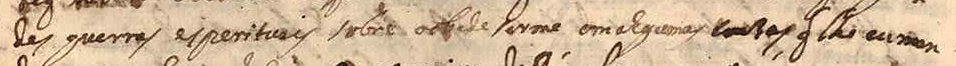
des guerras esperituais sobre o obedeserme em algumas couzas, q̄ lhe eu man
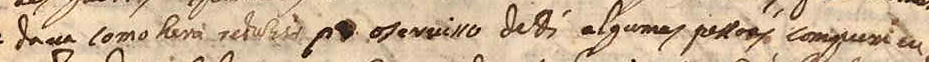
daua como hera reduzir p.a o seruisso de Ds̄ algumas pessoas com quem eu
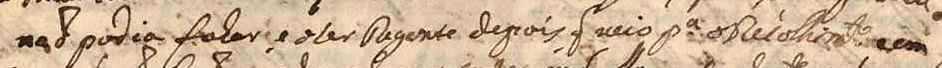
naõ podia falar, e o ser Regente depois q̄ ueio p.a o Recolhim.to, e em
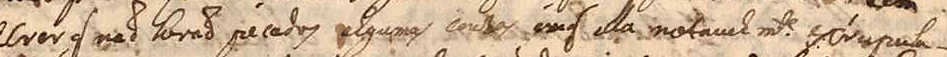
crer q̄ naõ heraõ pecados algumas couzas em q̄ ella notauelm.te escrupula
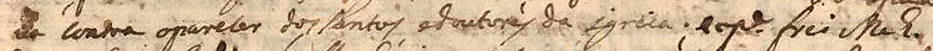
ua contra o parecer dos santos e doutores da Igreia; e o p.e frei Mel
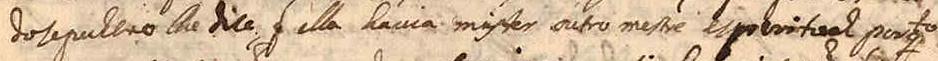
do sepulcro lhe dice, q̄ ella hauia mister outro mestre esperitual porqto
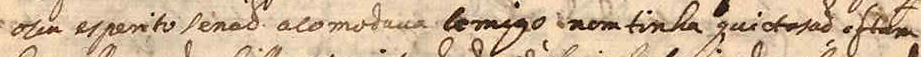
o seu esperito se naõ acomodaua comigo, nem tinha quietasaõ, e q̄ tam
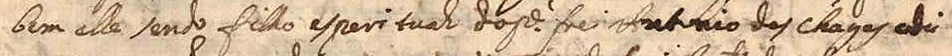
bem elle sendo filho esperitual do p.e frei Antonio das Chagas o dei
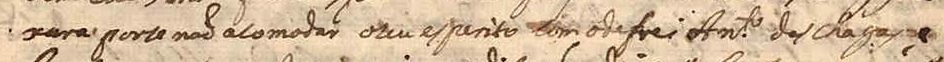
xara por se naõ acomodar o seu esperito com o de frei An.to das Chagas, e
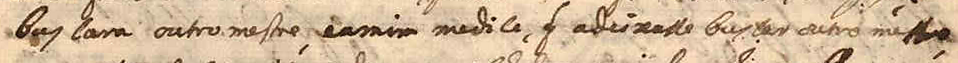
buscara outro mestre, e a mim me dice, q̄ a deixasse buscar outro mestre,
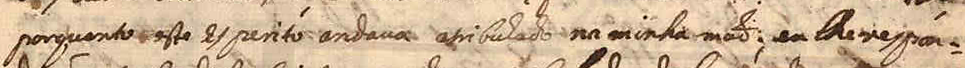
porquanto este Esperito andaua atribulado na minha maõ; eu lhe respon
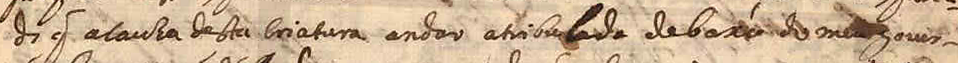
di q̄ a cauza desta Criatura andar atribulada debaxo do meu gouer
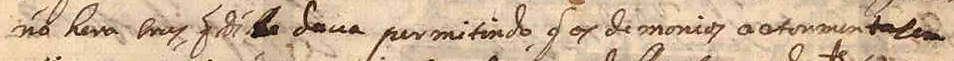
no hera crus, q̄ Ds̄ lhe daua permitindo, q̄ os demonios, a atormentasem
